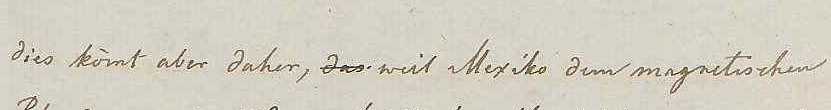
dies kömt aber daher, dasweil Mexiko dem magnetischen
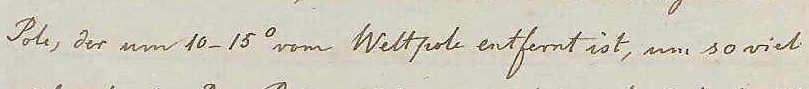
Pole, der um 10–15° vom Weltpole entfernt ist, um so viel
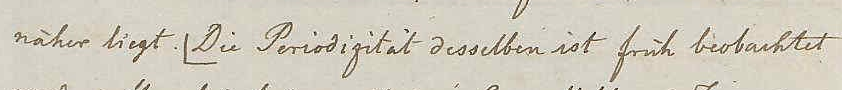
näher liegt. ￼ Die Periodizität desselben ist früh beobachtet
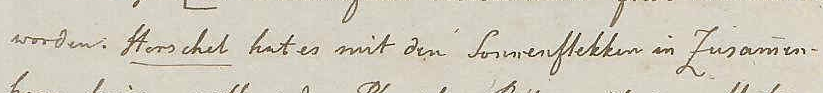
worden. Herschel hat es mit den Sonnenflekken in Zusam̃en-
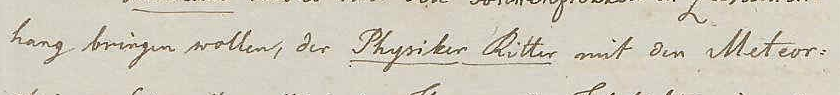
hang bringen wollen, der Physiker Ritter mit den Meteor-
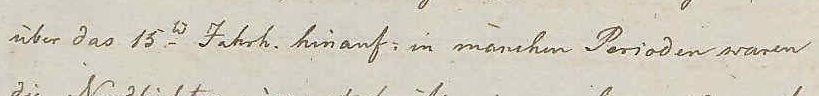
über das 15￼ Jahrh. hinauf: in manchen Perioden waren
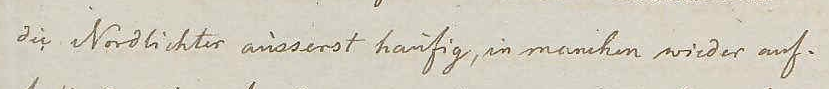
die Nordlichter äusserst häufig, in manchen wieder auf-
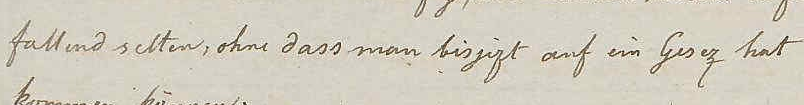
fallend selten, ohne dass man bis jezt auf ein Gesez hat
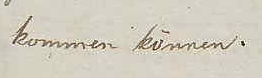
kommen können.
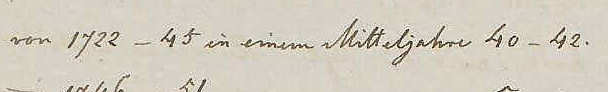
von 1722–45 in einem Mitteljahre 40–42.
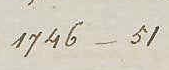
1746–51 — " — 5.
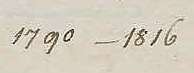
1790–1816
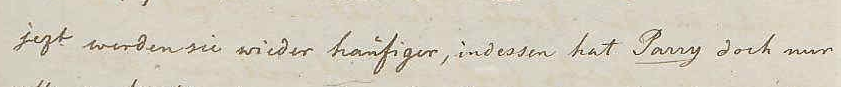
jezt werden sie wieder häufiger, indessen hat Parry doch nur
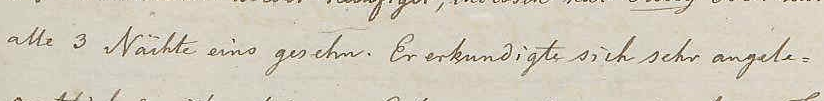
alle 3 Nächte eins gesehn. Er erkundigte sich sehr angele-
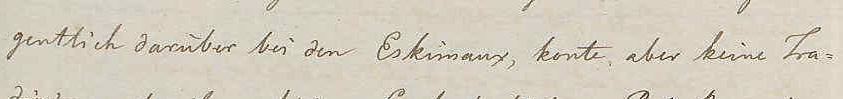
gentlich darüber bei den Eskimaux, konte aber keine Tra-
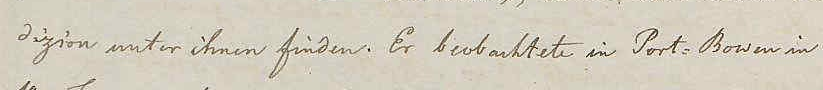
dizion unter ihnen finden. Er beobachtete in Port-Bowen in
